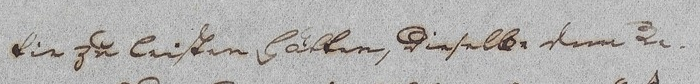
tie zu leisten hätten, dieselbe dem Re-
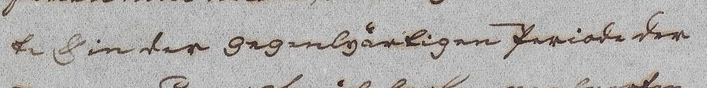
te & in der gegenwärtigen Periode der
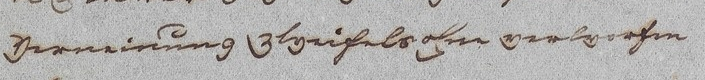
Verneinung zweifelsohne verworfen
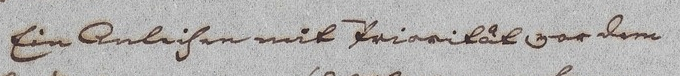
Ein Anleihen mit Priorität vor dem
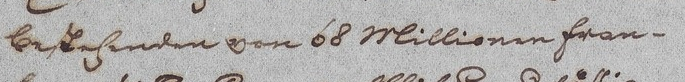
bestehenden von 68 Millionen Fran-
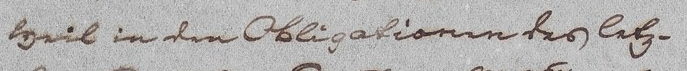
weil in den Obligationen des letz-
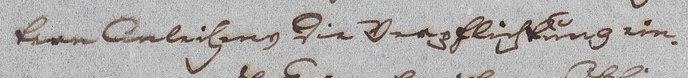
tern Anleihens die Verpflichtung ein-
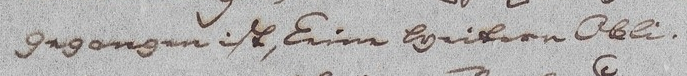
gegangen ist, keine weiteren Obli-
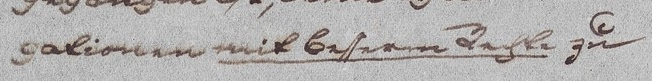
gationen mit besserm Rechte zu
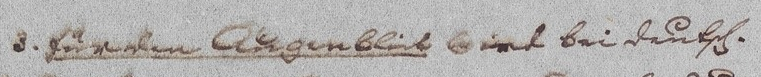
3. Für den Augenblick wird bei Deutsch-
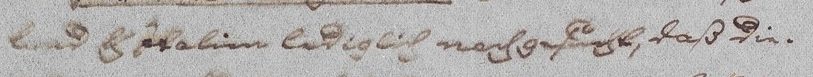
land & Italien lediglich nachgesucht, daß die-
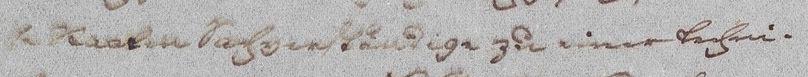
se Staaten Sachverständige zu einer techni-
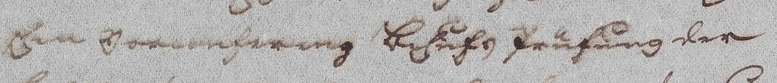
schen Vorconferenz Behufs Prüfung der
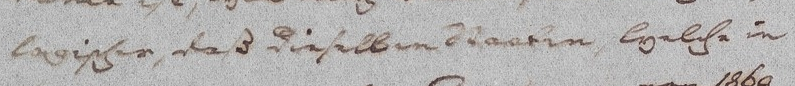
logischer, daß dieselben Staaten, welche in
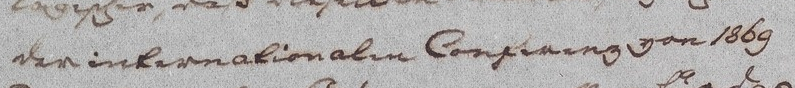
der internationalen Conferenz von 1869
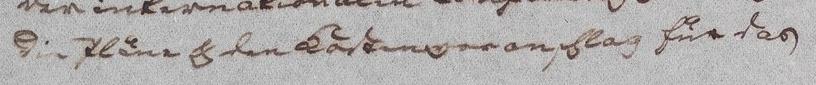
die Pläne & den Kostenvoranschlag für das
